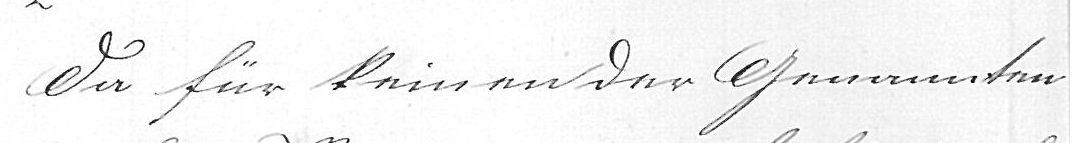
Der für keinen der Genannten
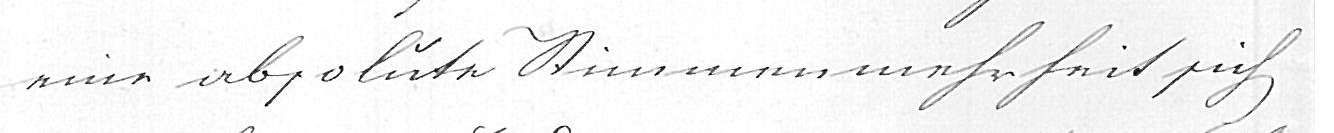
eine absolute Stimmenmehrheit sich
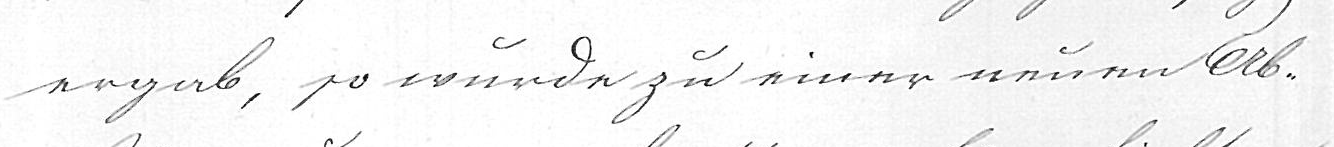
ergab, so wurde sind einer neuen Ab-
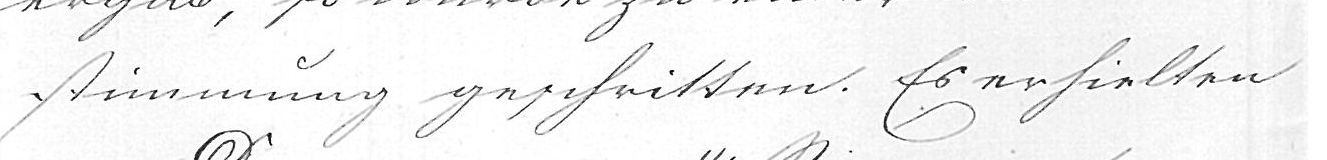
stimmung geschritten. Es erhielten
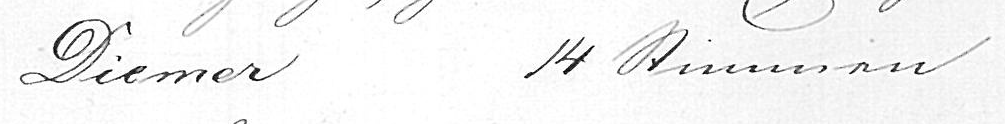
Diemer 14 Stimmen
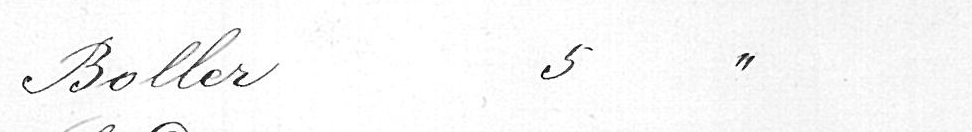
Boller 5 "
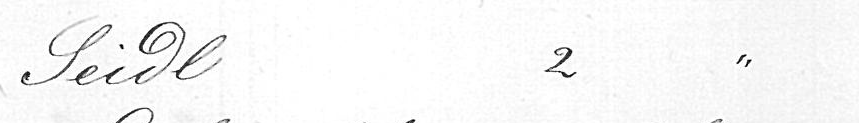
Siedl 2 "
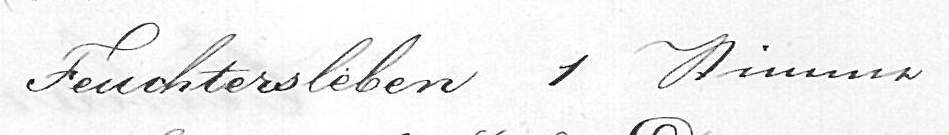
Feuchtersleben 1 Stimme
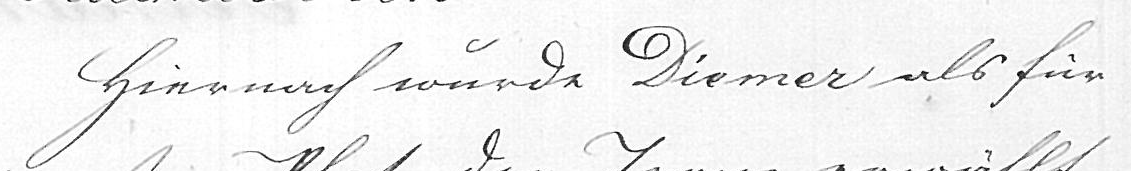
Hiernach wurde Diemer als für
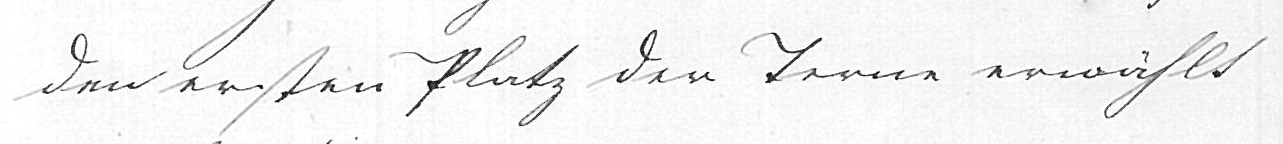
den ersten Platz der Terne erwählt
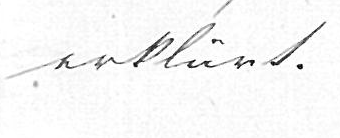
erklärt.
